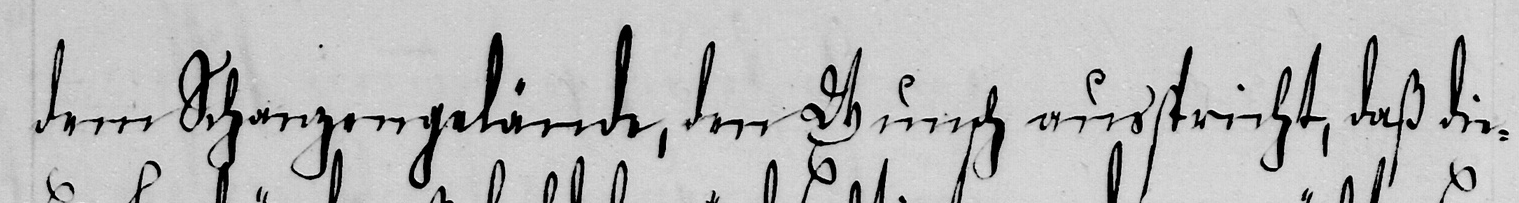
dem Schanzengelände, den Wunsch ausspricht, daß di¬
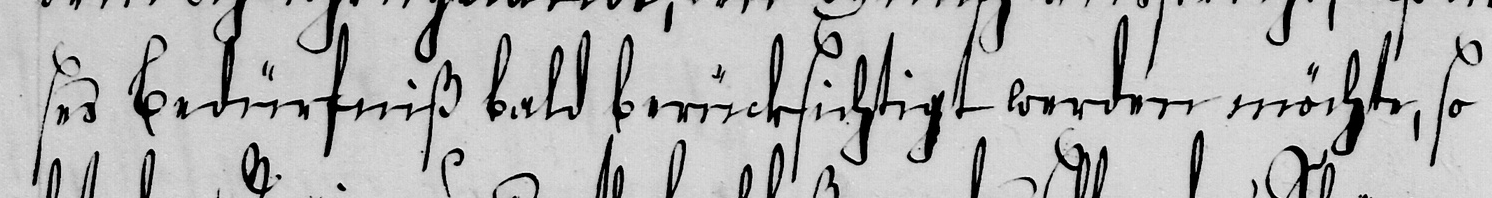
eses Bedürfniß bald berücksichtigt werden möchte, so
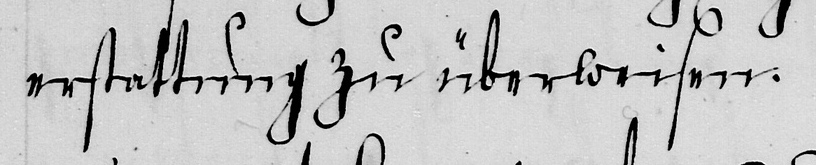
erstattung zu überweisen.
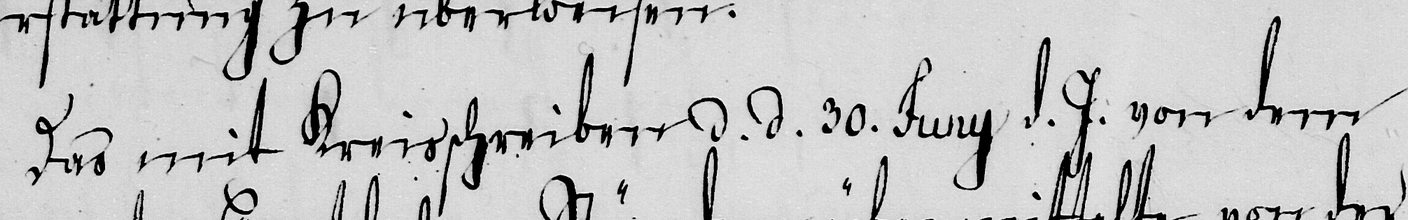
Das mit Kreisschreiben d. d. 30. Juny d. J. von dem
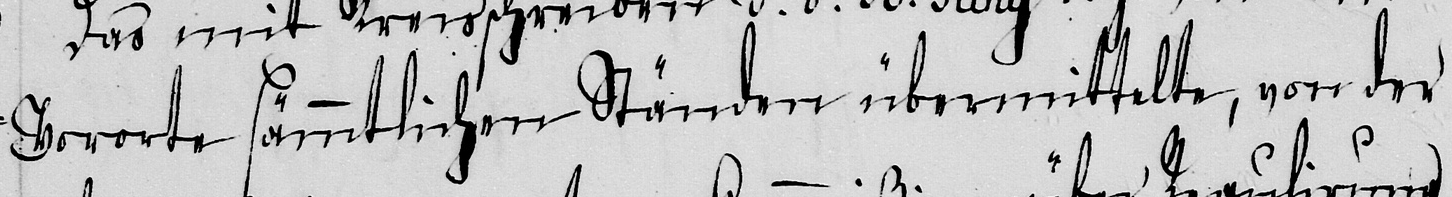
Vororte sämmtlichen Ständen übermittelte, von der
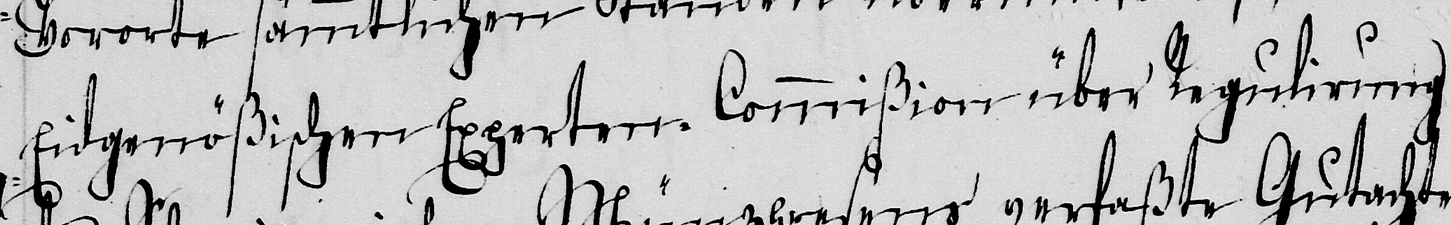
Eidgenößischen Experten-Commißion über Regulierung
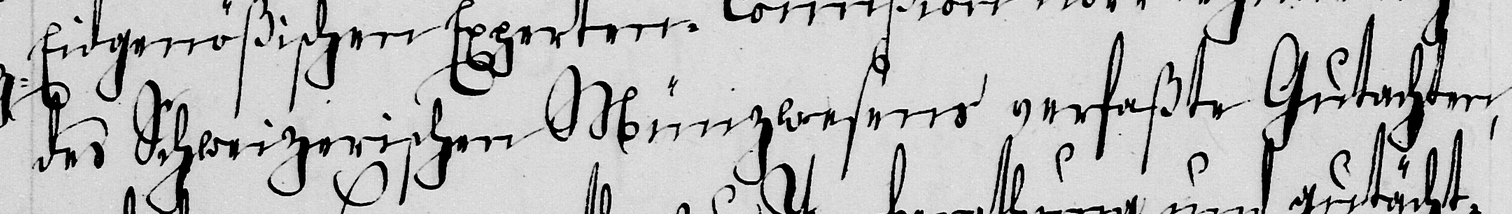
des Schweizerischen Münzwesens verfaßte Gutachten,
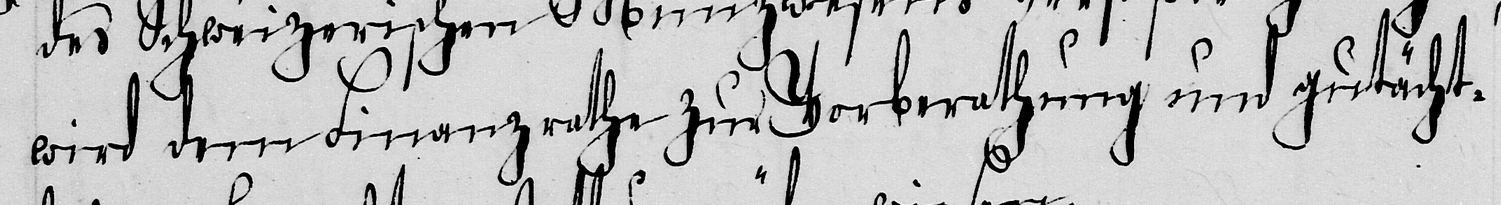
wird dem Finanzrathe zur Vorberathung und gutächt¬
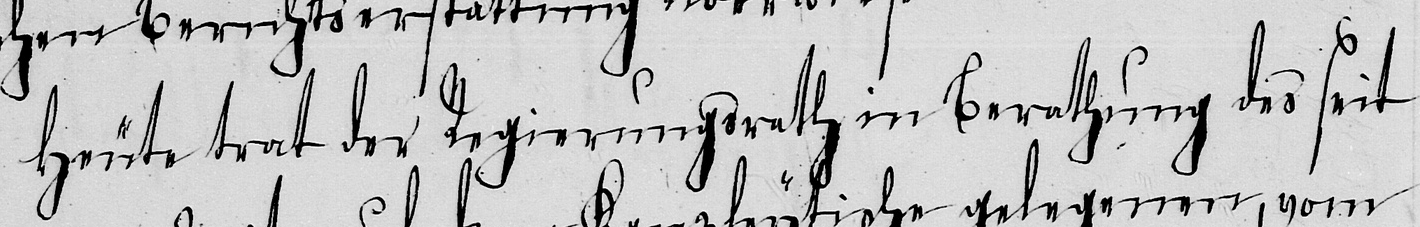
Heute trat der Regierungsrath in Berathung des seit
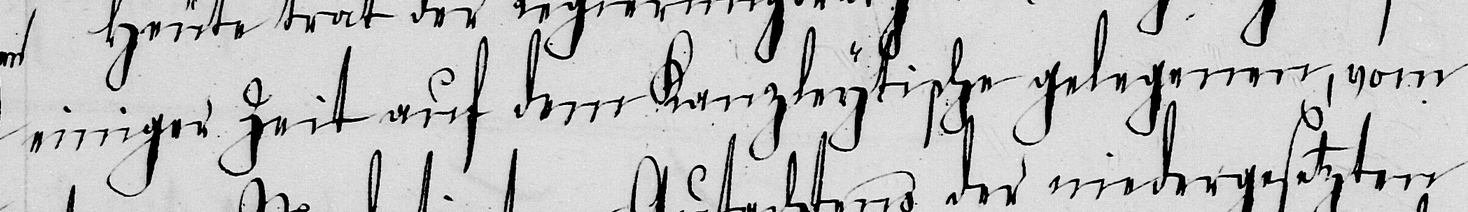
einiger Zeit auf dem Kanzleytische gelegenen, vom
